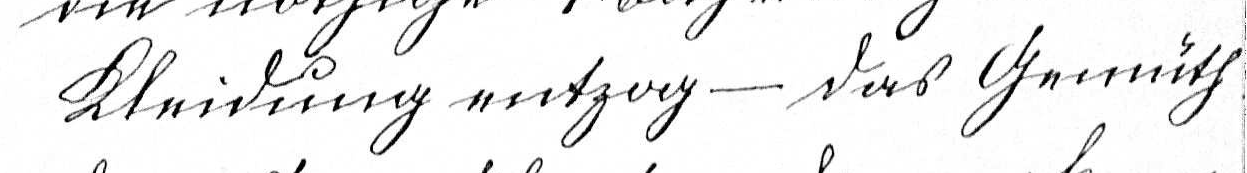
Kleidung entzog – das Gemüth
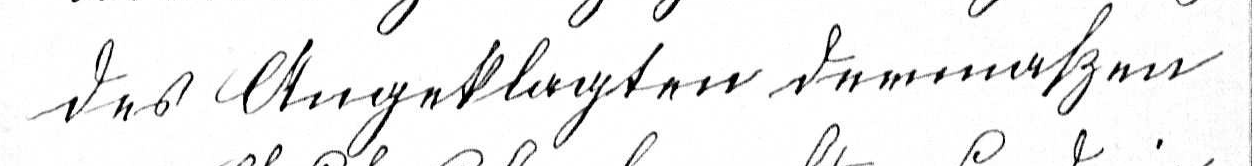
des Angeklagten dermaßen
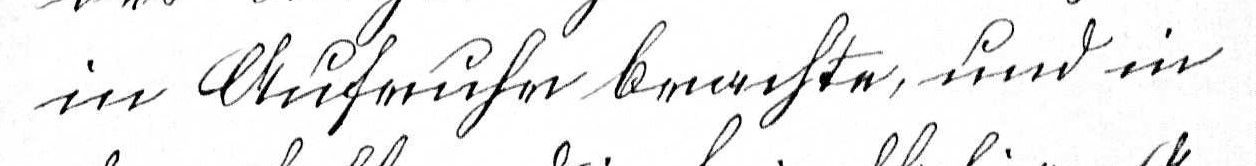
in Aufruhe brachte, und in
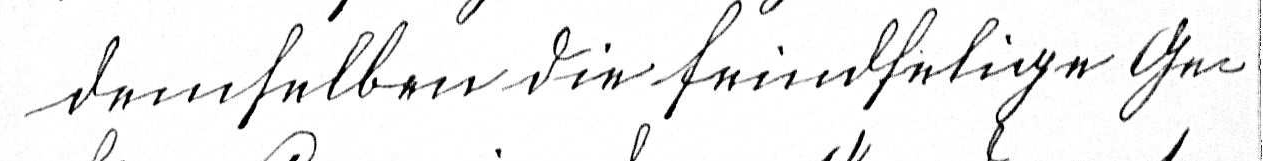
demselben die feindselige Ge¬
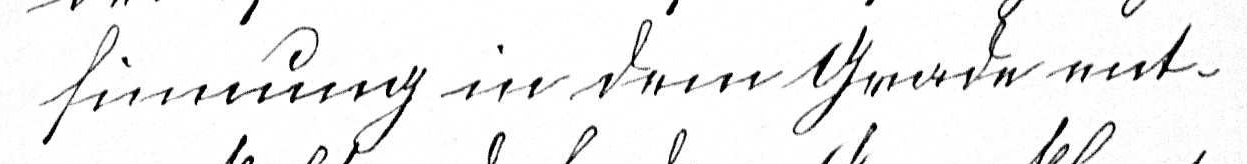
sinnung in dem Grade ent¬
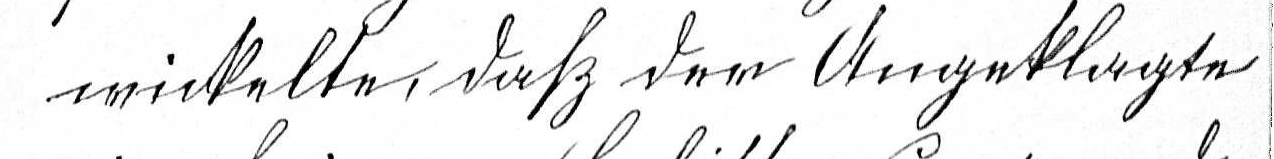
wickelte, daß der Angeklagte
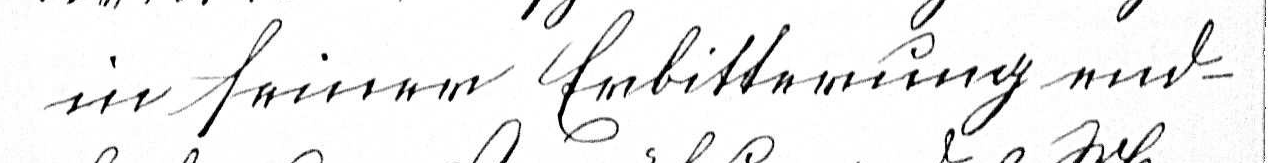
in seiner Erbitterung end¬
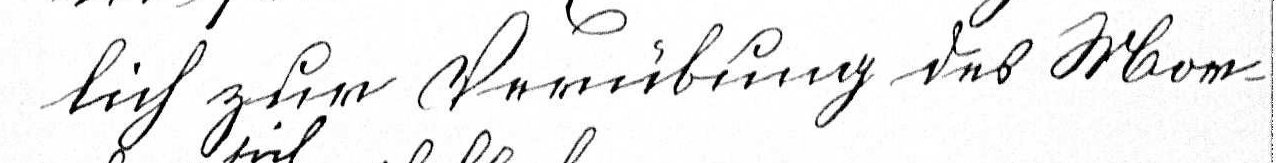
lich zur Verübung des Mor¬
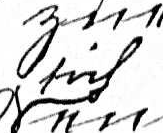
sich
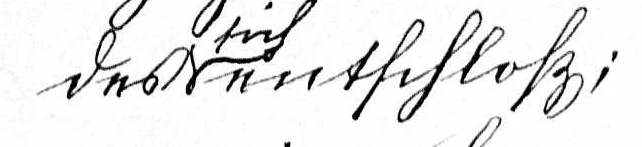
des enthschloß;
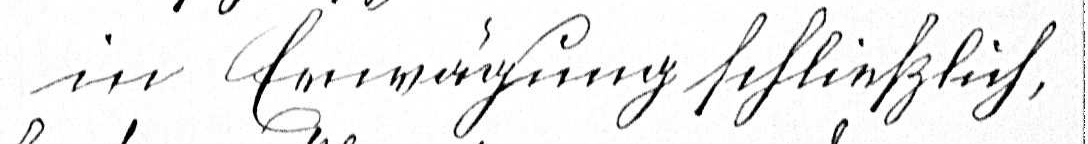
In Erwägung schließlich,
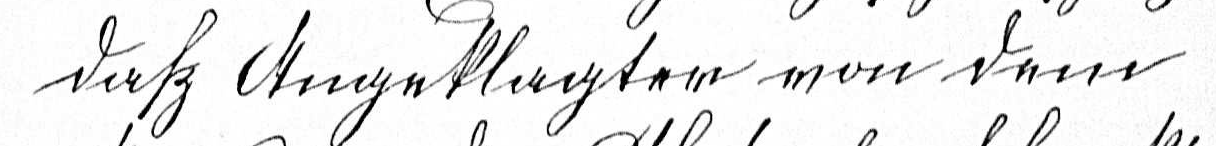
daß Angeklagter von dem
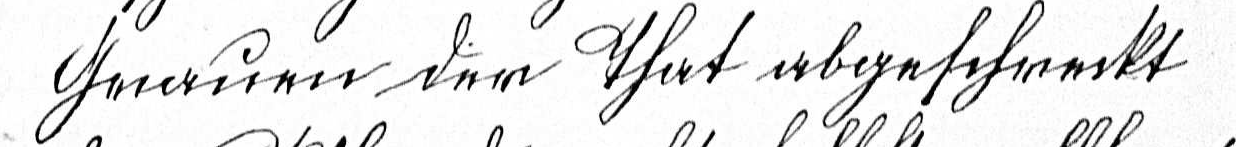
Grauen der That abgeschreckt
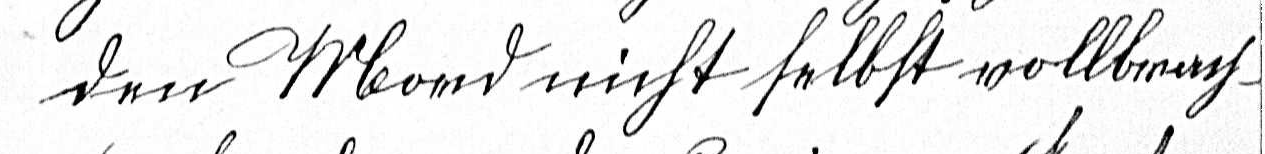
den Mord nicht selbst vollbrach¬
